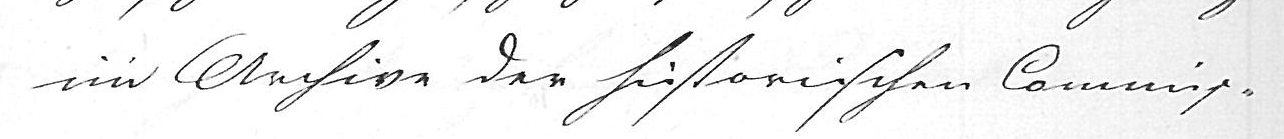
im Archive der historischen Commis-
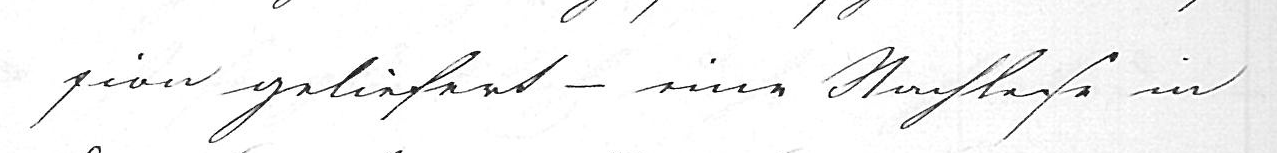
tion geliefert - eine Nachlese in
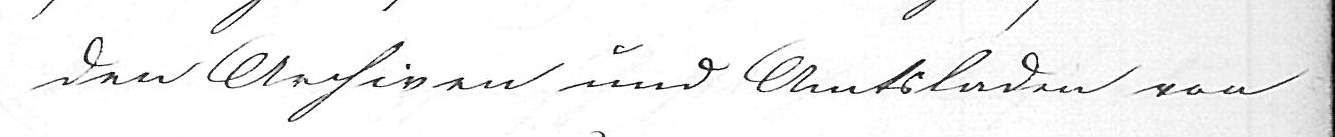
den Archiven und Amtsladen von
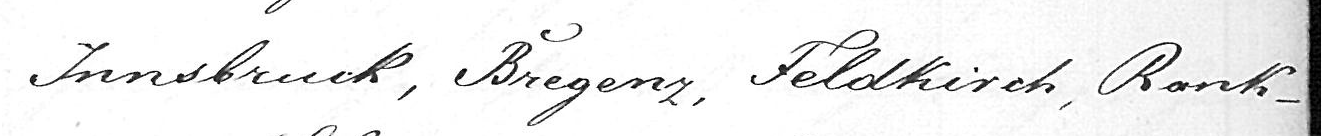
Innsbruck, Bregenz, Feldkich, Rank-
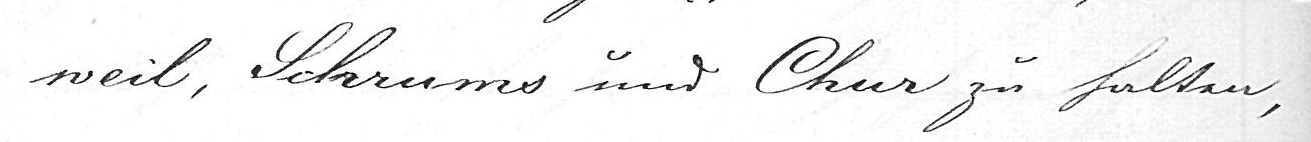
weil, Schrums und Chur zu halten,
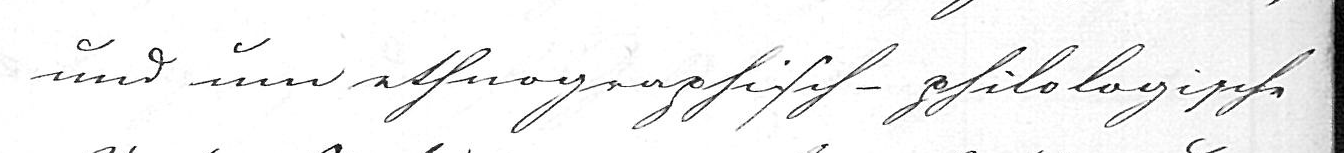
und um ethnographisch-philologische
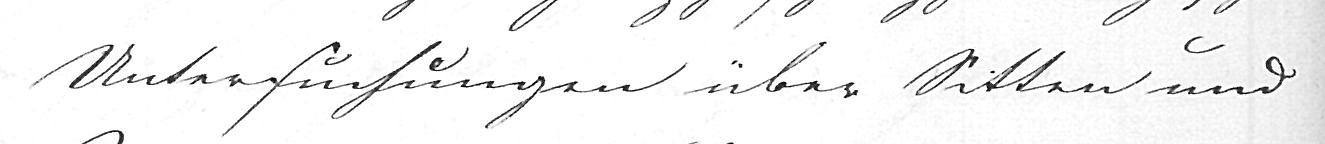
Untersuchungen über Sitten und
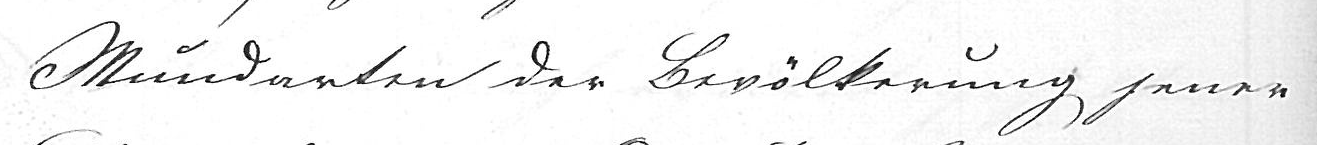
Mundarten der Bevölkerung jener
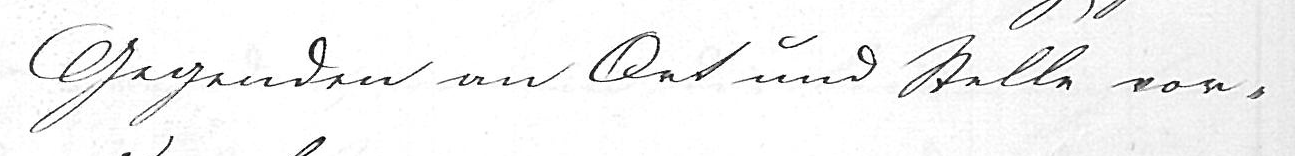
Gegenden an Ort und Stelle vor-
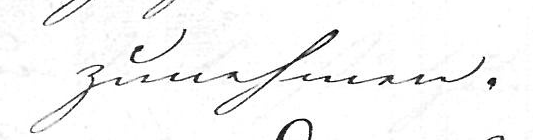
zunehmen.
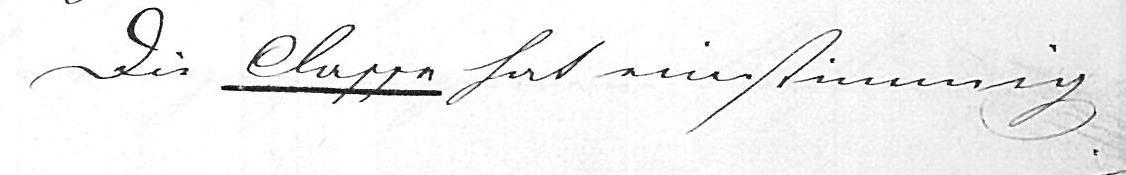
Die Classe hat einstimmig
